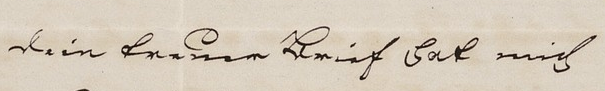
Dein treuer Brief hat mich
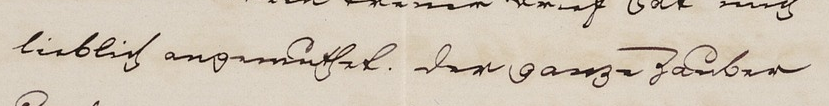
lieblich angemuthet. Der ganze Zauber
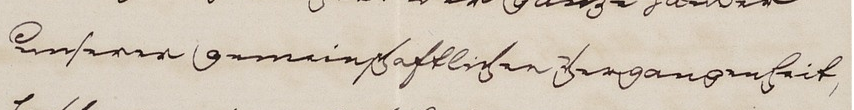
unserer gemeinschaftlichen Vergangenheit,
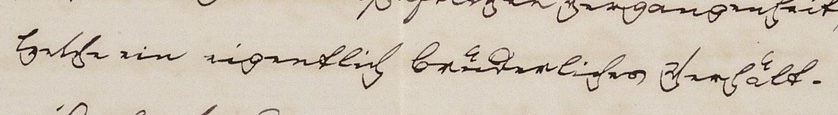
welche ein eigentlich brüderliches Verhält-
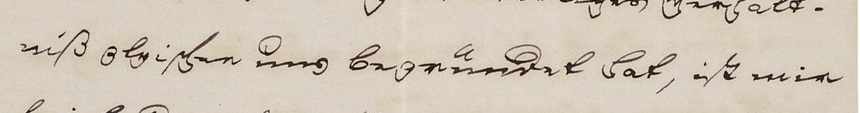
niß zwischen uns begründet hat, ist mir
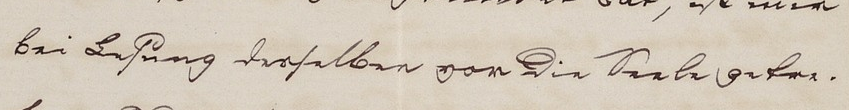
bei Lesung desselben vor die Seele getre-
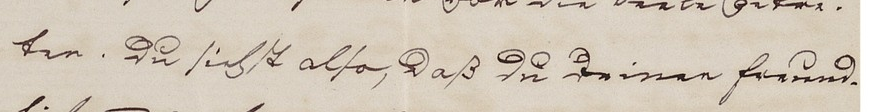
ten. Du siehst also, daß Du Deinen freund-
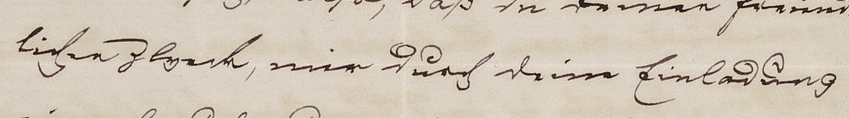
lichen Zweck mir durch Deine Einladung
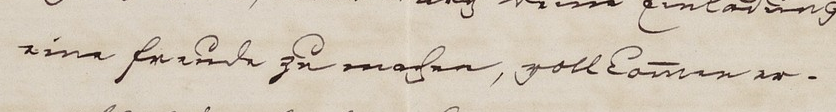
eine Freude zu machen, vollkommen er-
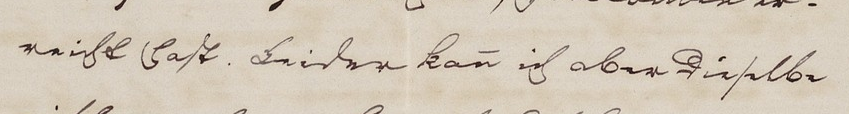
reicht hast. Leider kann ich aber dieselbe
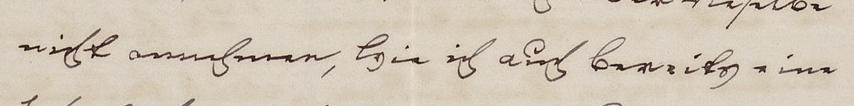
nicht annehmen, wie ich auch bereits eine
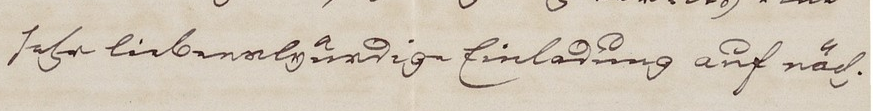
sehr liebenswürdige Einladung auf näch-
